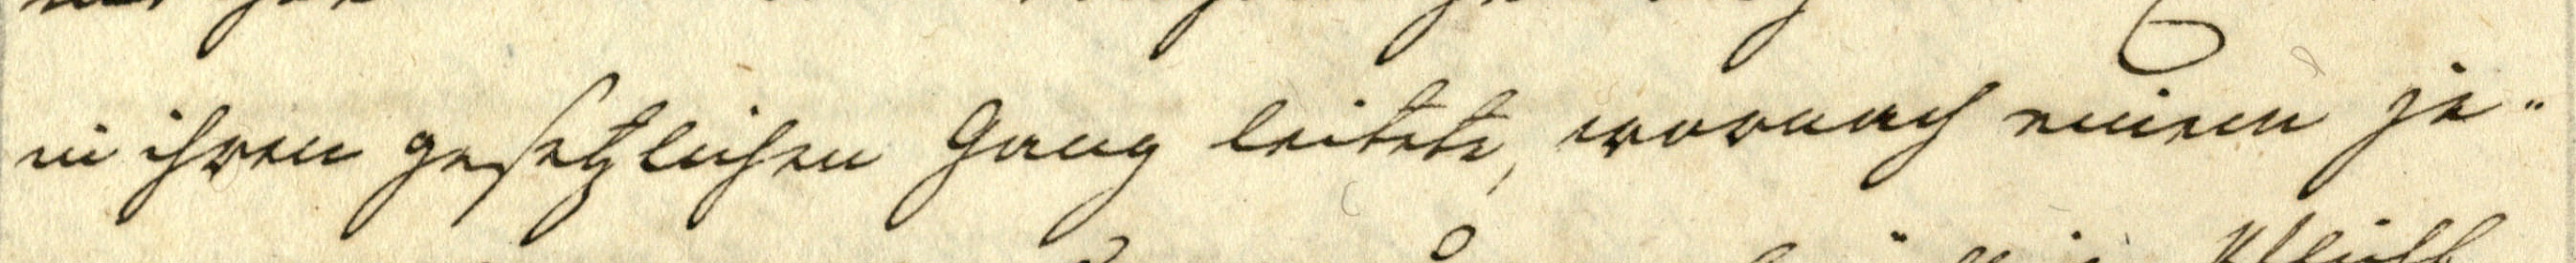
in ihren gesetzlichen Gang leitete, wornach einem je¬
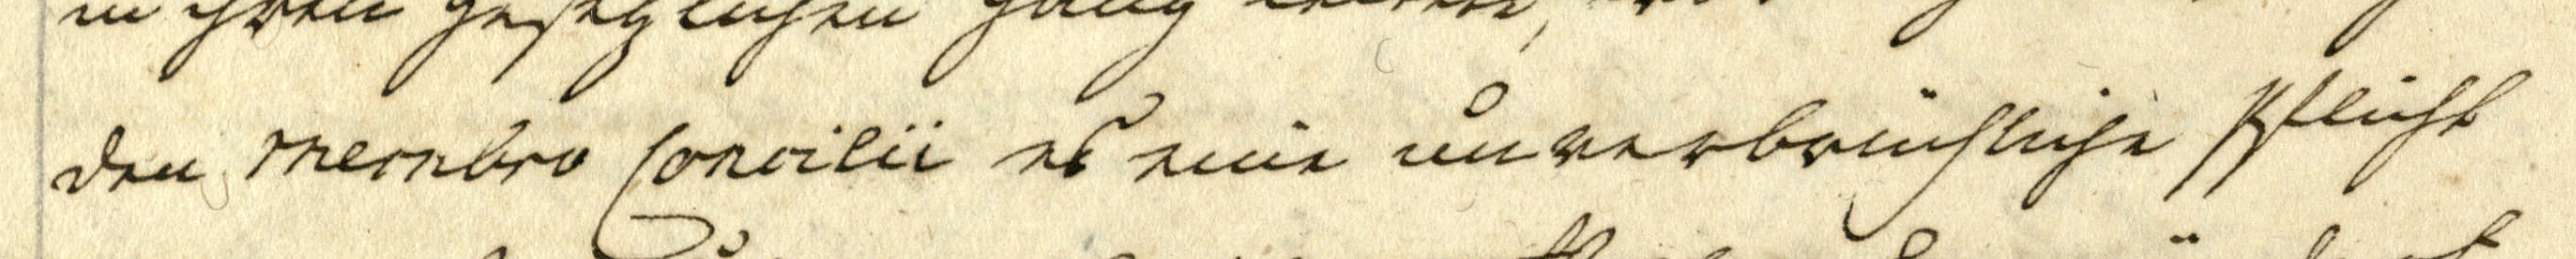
den membro Concilii es eine umverbrüchliche Pflicht
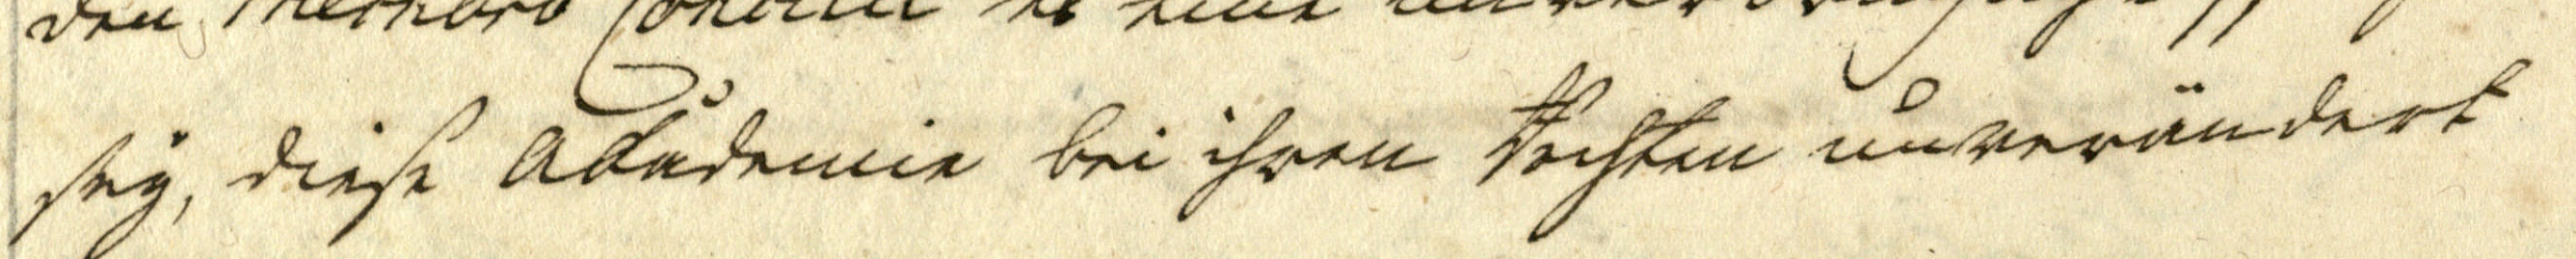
seÿ, diese Akademie bei ihren Rechten unverändert
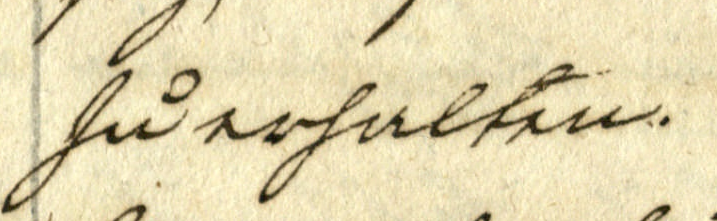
zu erhalten.
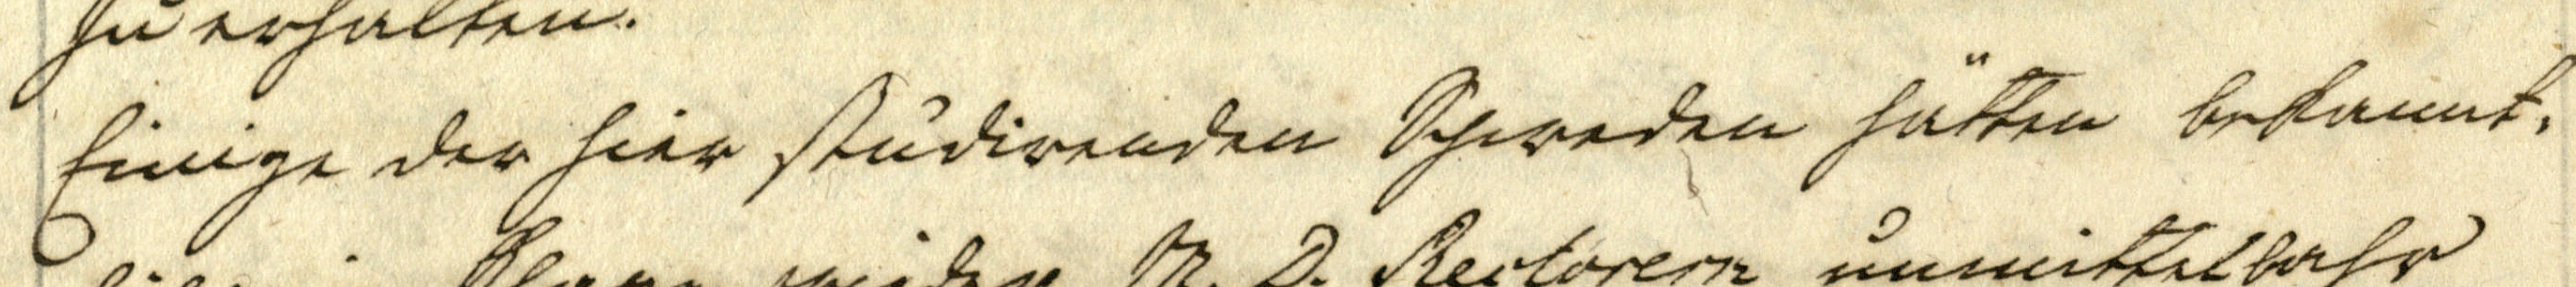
Einige der hier studirenden Schweden hätten bekannt¬
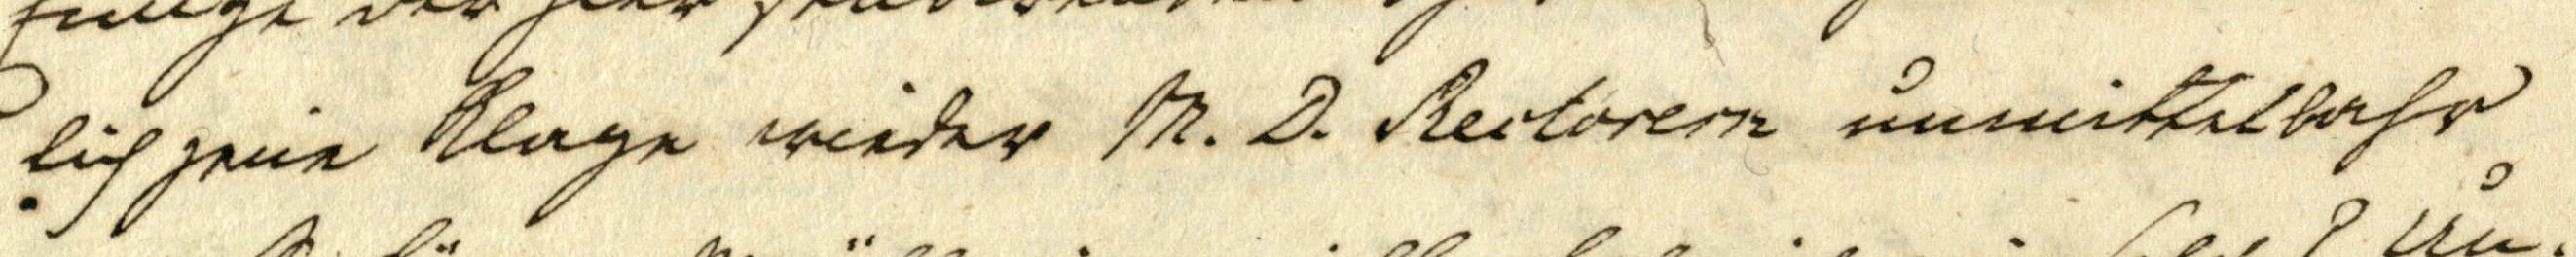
lich jene Klage wieder M. D. Rectorem ummittelbahr
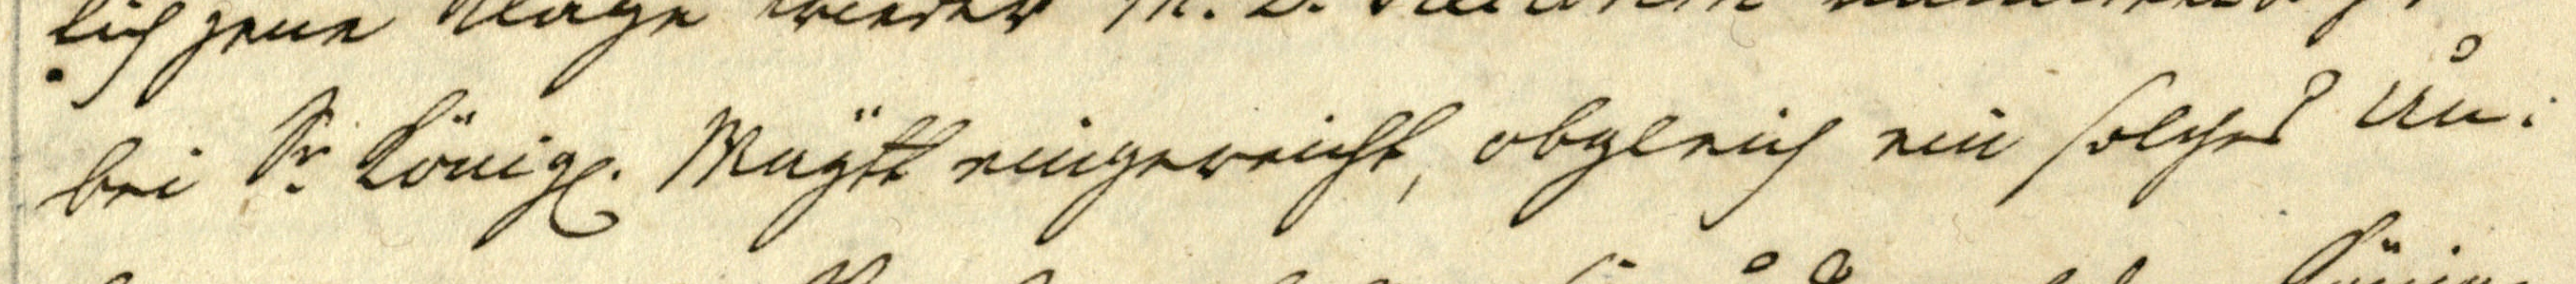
bei Sr Königl. Maÿtt eingereicht, obgleich ein solches Un¬
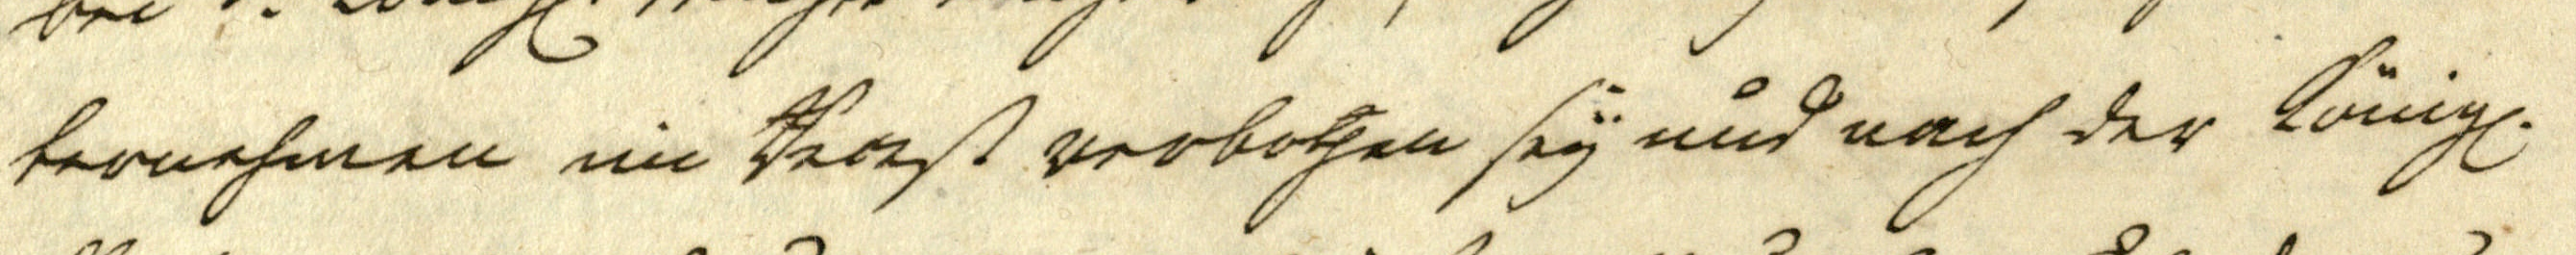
ternehmen im Receß verbothen seÿ und nach der Königl.
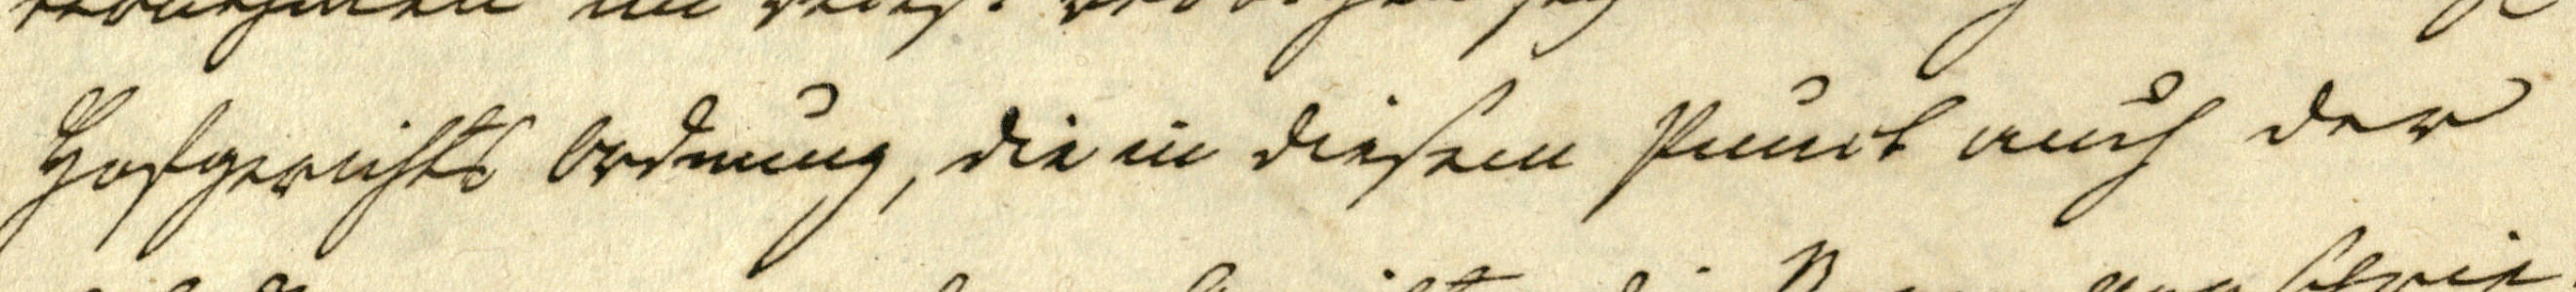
Hofgerichts Ordnung, die in diesem Punct auch der
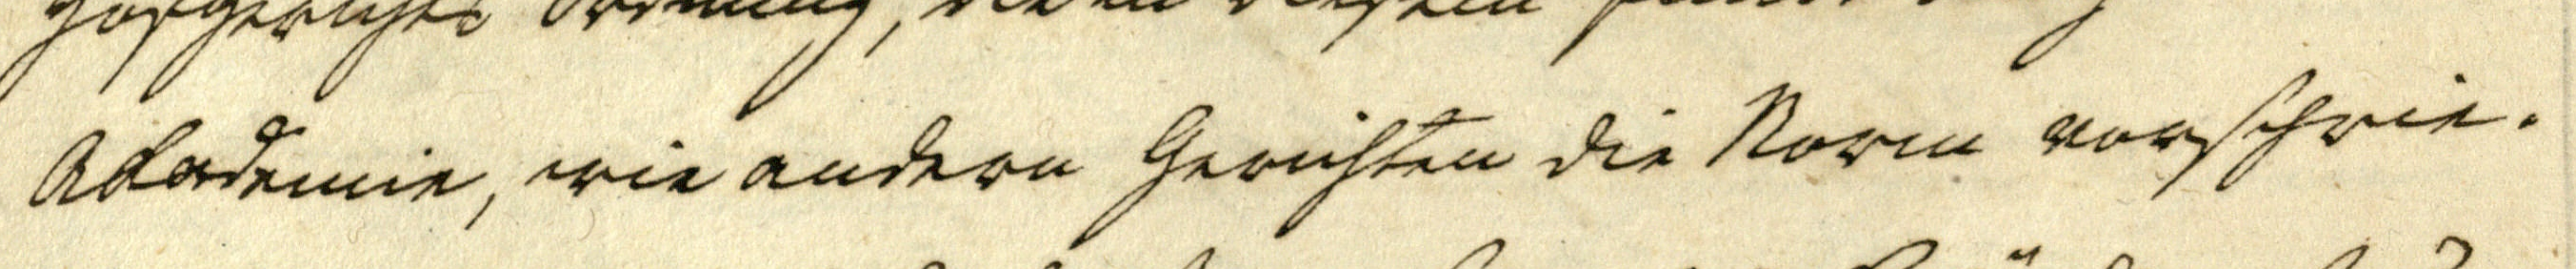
Akademie, wie andern Gerichten die Norm vorschrie¬
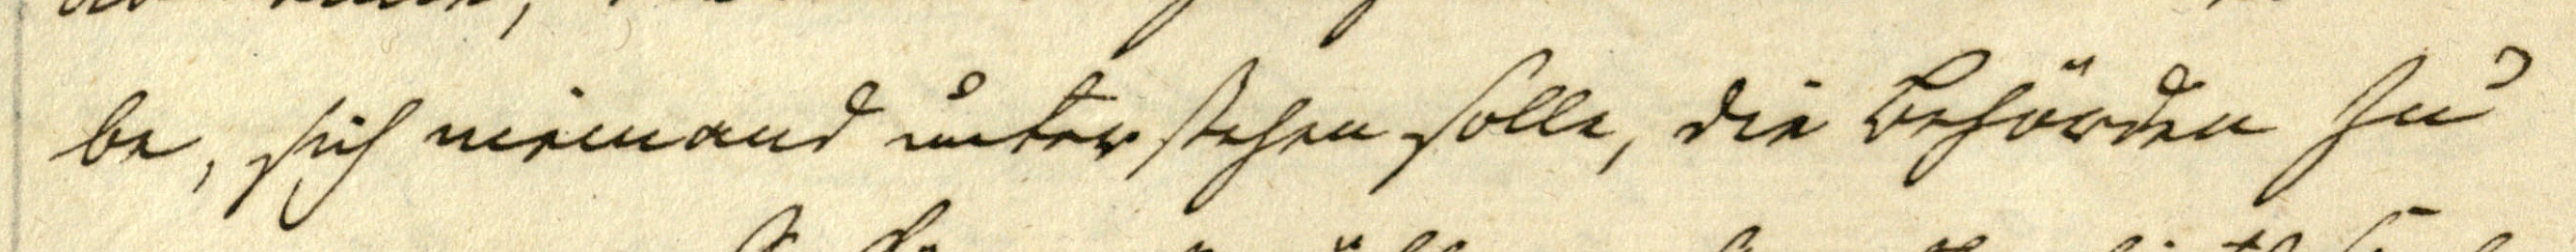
be, sich niemand unter stehen solle, die Behörden zu
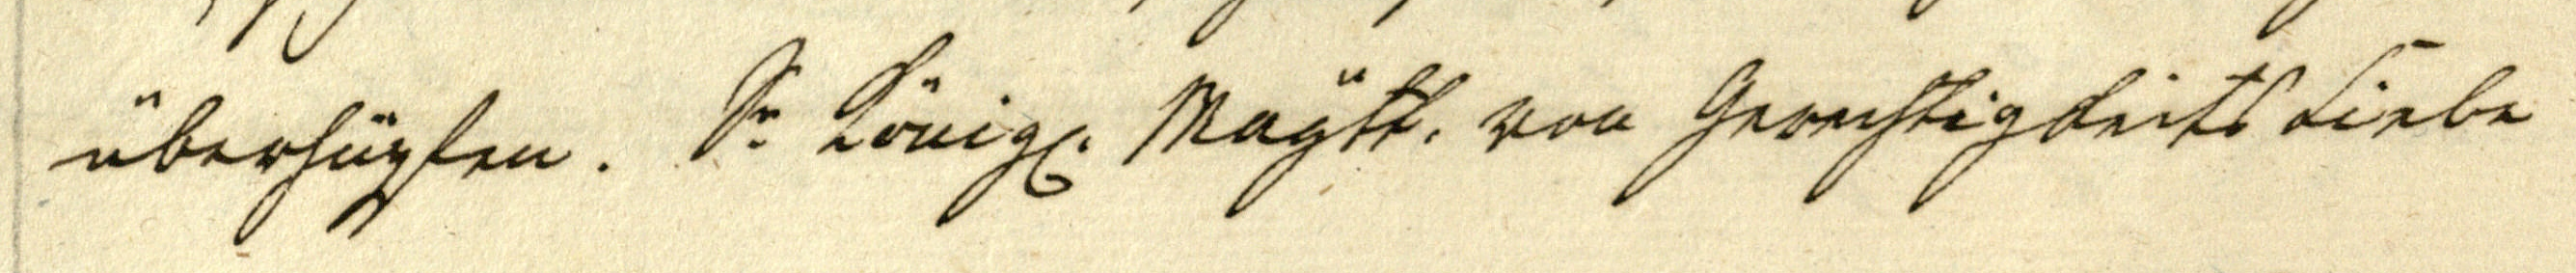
überhüpfen. Sr Königl. Maÿtt. von Gerechtigkeits Liebe
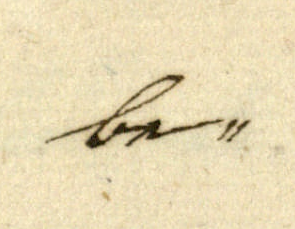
be
